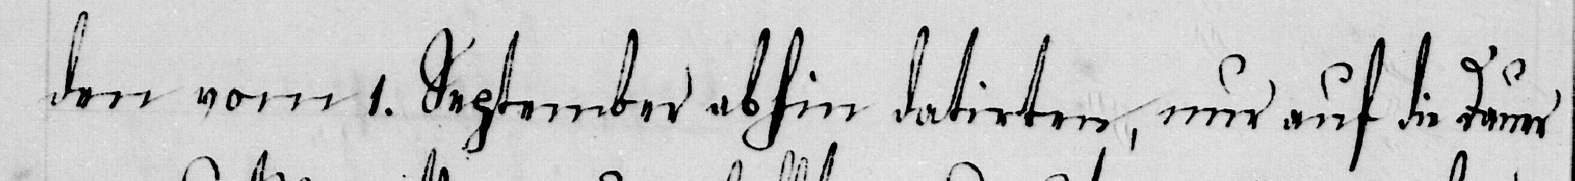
den vom 1. September abhin datirten, nur auf die Da¬
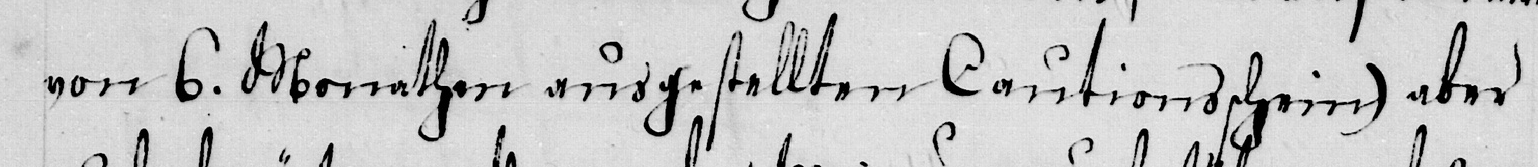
von 6. Monathen ausgestellten Cautionsschein) aber
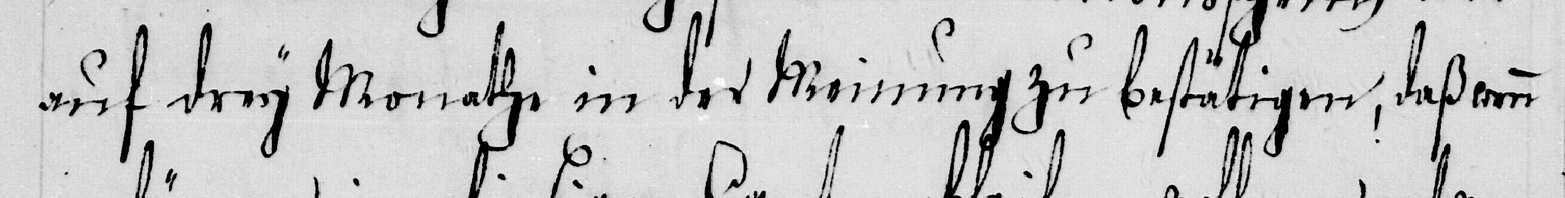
auf drey Monathe in der Meinung zu bestätigen, daß wenn
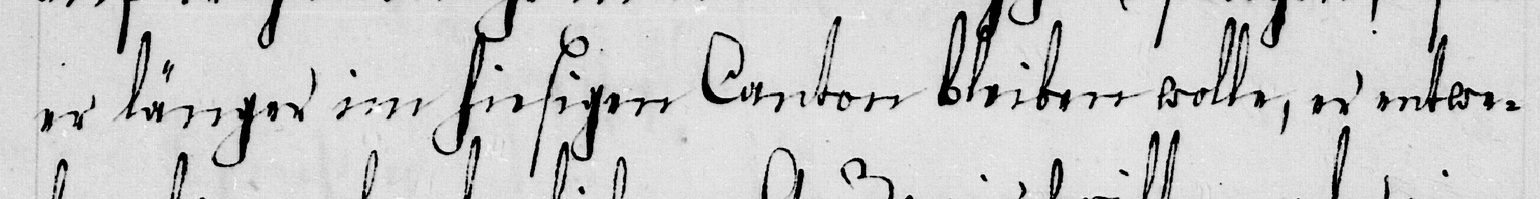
er länger im hiesigen Canton bleiben wolle, er entwe¬
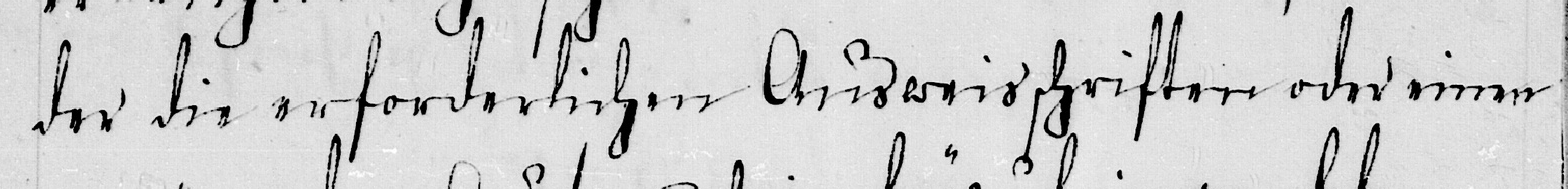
der die erforderlichen Ausweisschriften oder einen
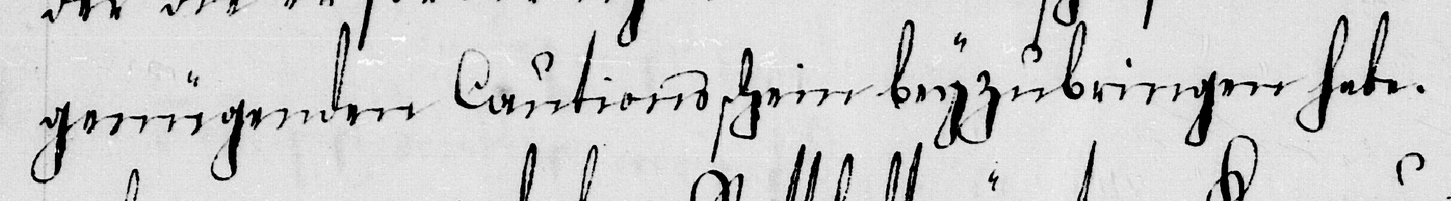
genügenden Cautionsschein beyzubringen habe.
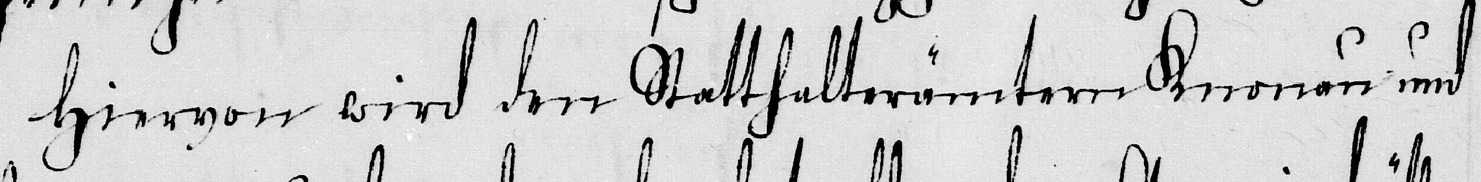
Hiervon wird den Statthalterämtern Knonau und
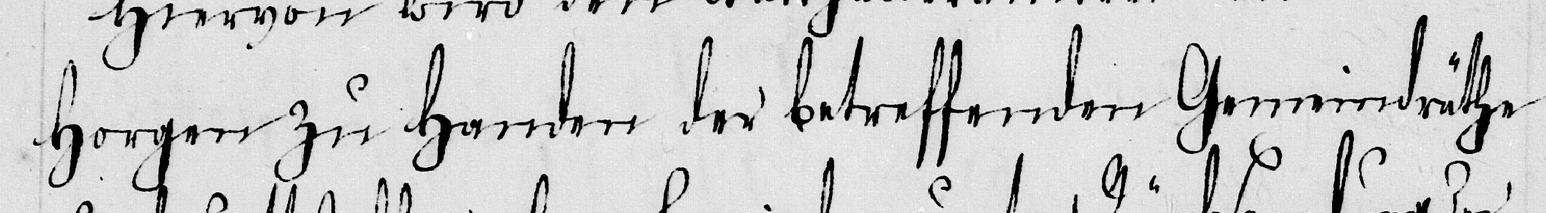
Horgen zu Handen der betreffenden Gemeindräthe
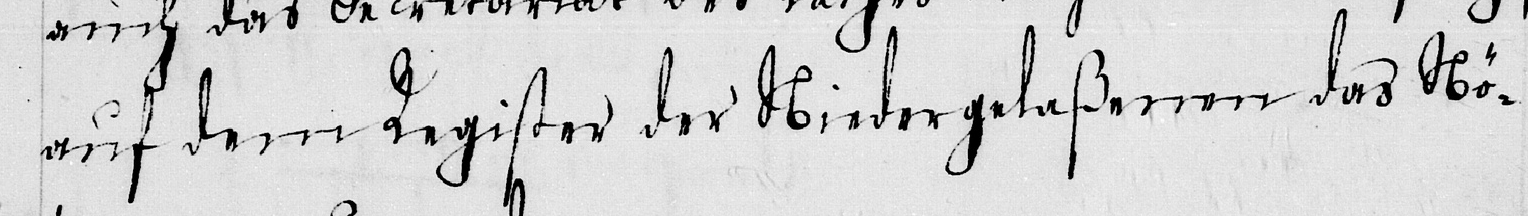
auf dem Register der Niedergelaßenen das Nö¬
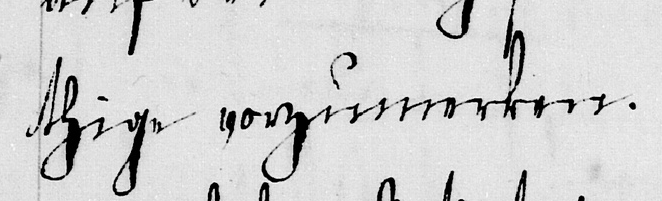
thige vorzumerken.
